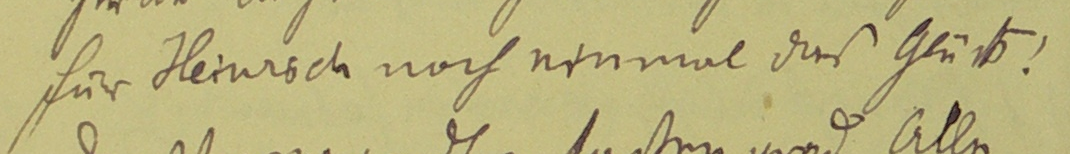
für Heinrich nochmal das Glück!
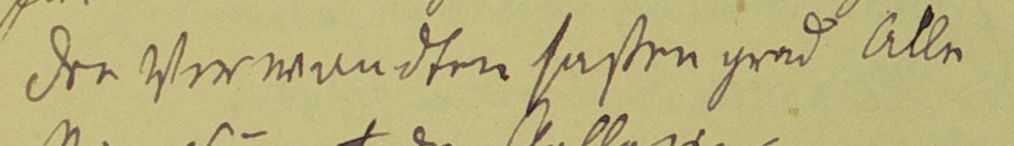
Die Verwandten saßen grad Alle
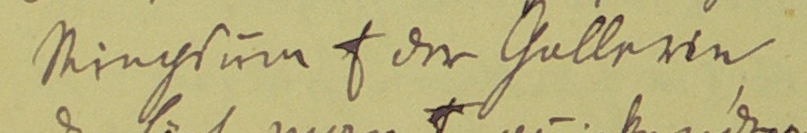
ringsum auf der Gallerie
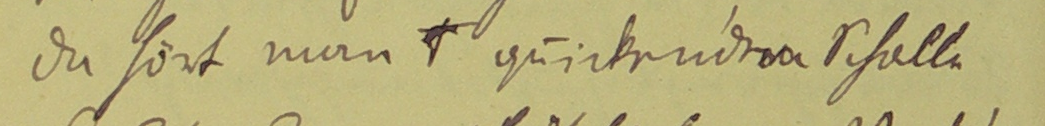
da hört man mit quickendem Schalle
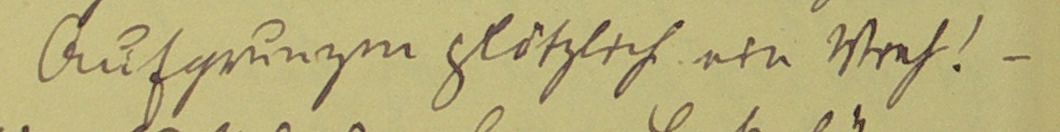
Aufgrunzen plötzlich ein Vieh
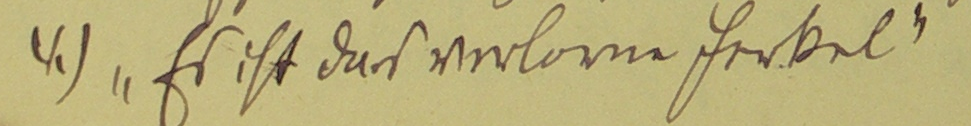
4) „Es ist das verlorene Ferkel“
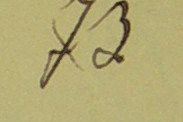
73
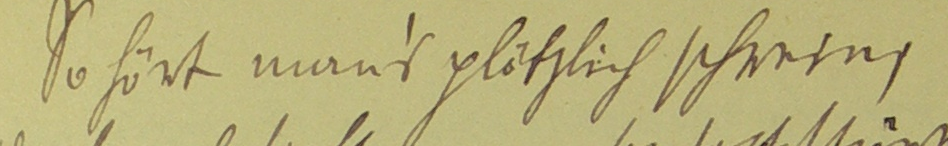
So hört man‘s plötzlich schrein
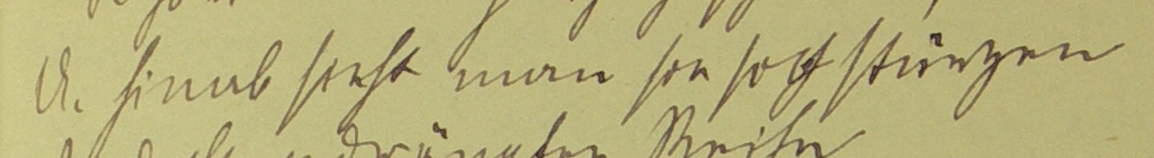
und hinab sieht man sie sogleich stürzen
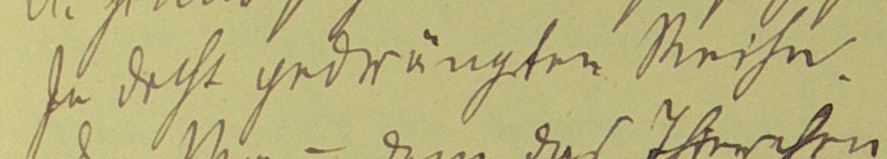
in dicht gedrängten Reihn
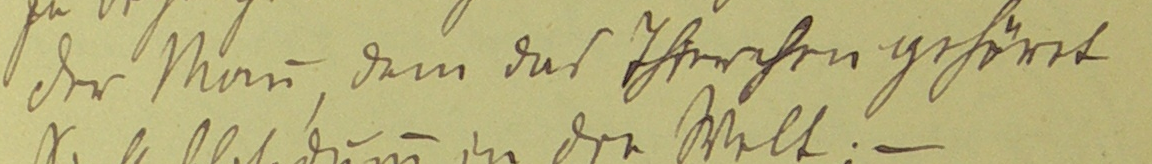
der Mann, dem das Thirchen? gehört
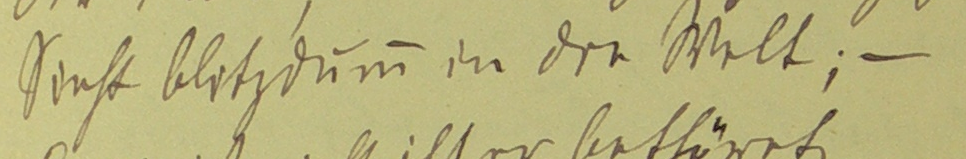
Sieht blitzdumm in die Welt;-
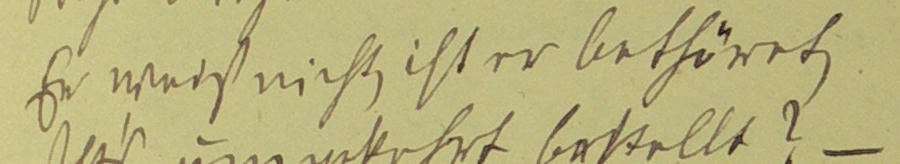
Er weiß nicht, ist er bethöret
